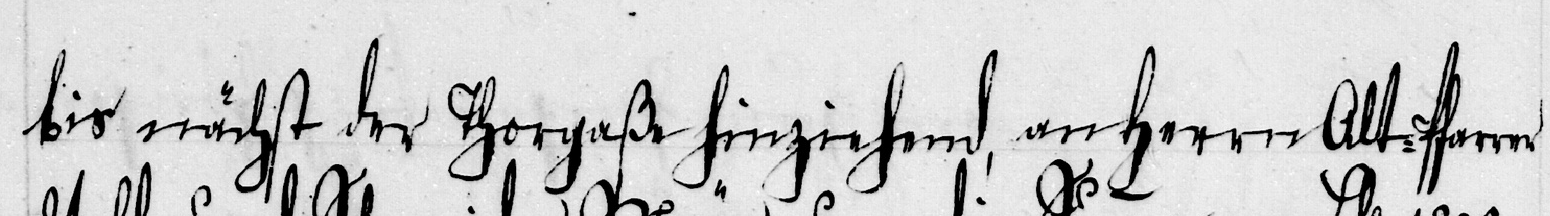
bis nächst der Thorgaße hinziehend, an Herrn Alt-Pfar¬
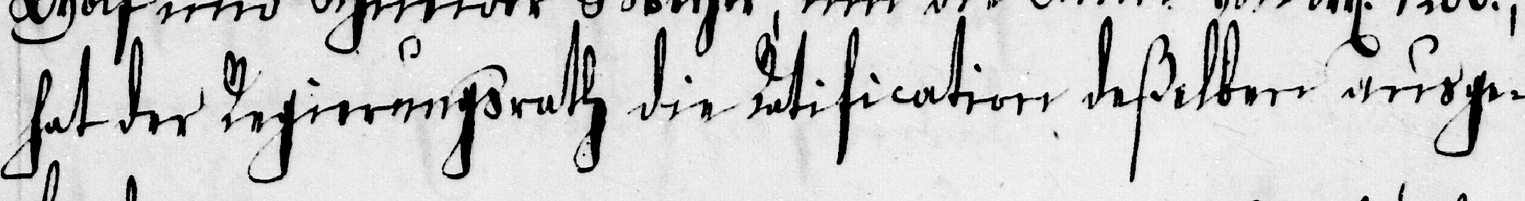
hat der Regierungsrath die Ratification deßelben ausge¬
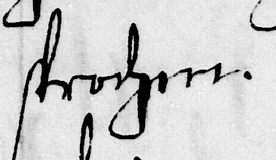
sprochen.
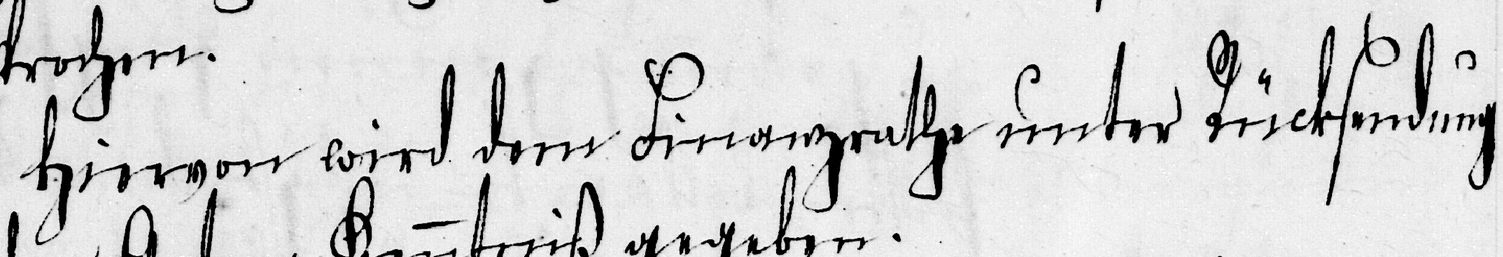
Hiervon wird dem Finanzrathe unter Rückforde¬
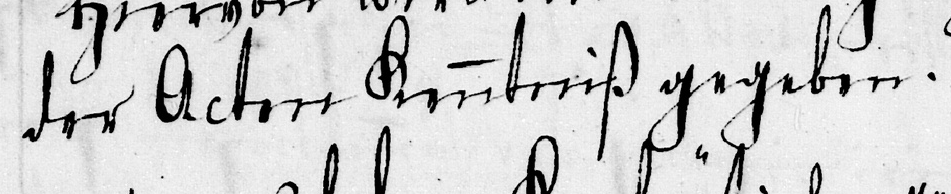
der Acten Kenntniß gegeben.
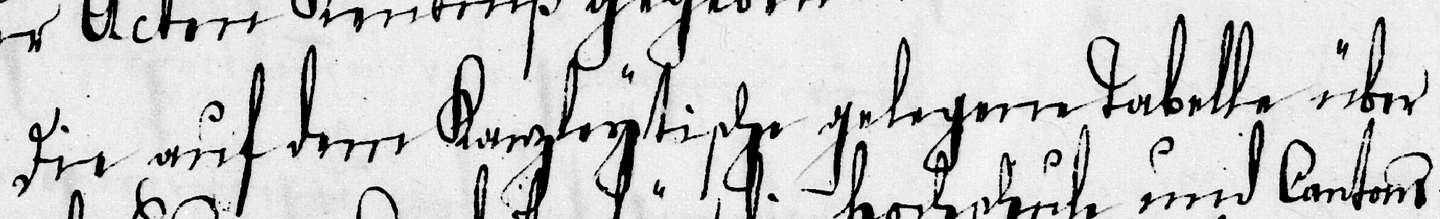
Die auf dem Kanzleytische gelegene Tabelle über
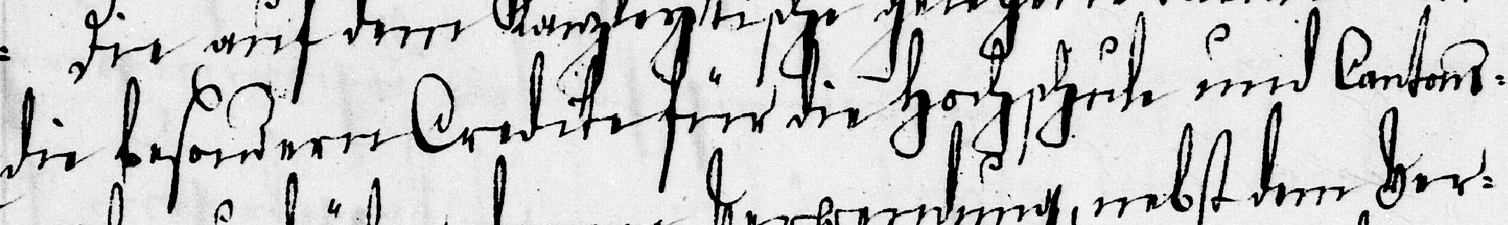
die besonderen Credite für die Hochschule und Cantons¬
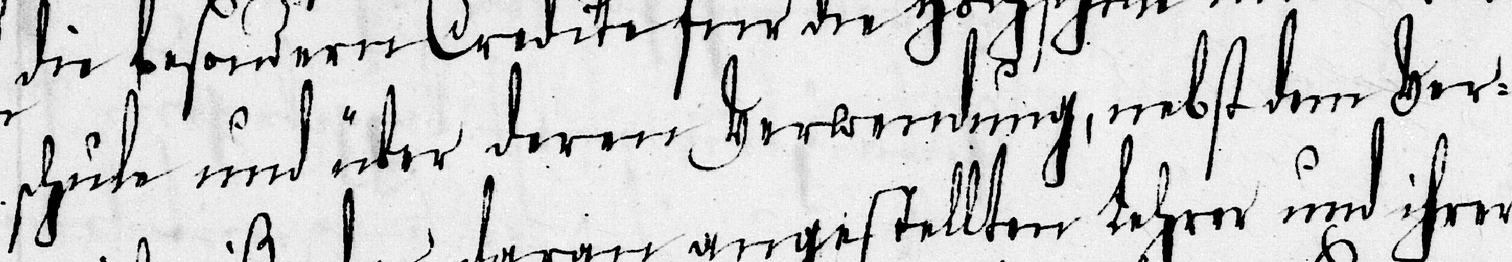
schule und über deren Verwendung, nebst dem Ver¬
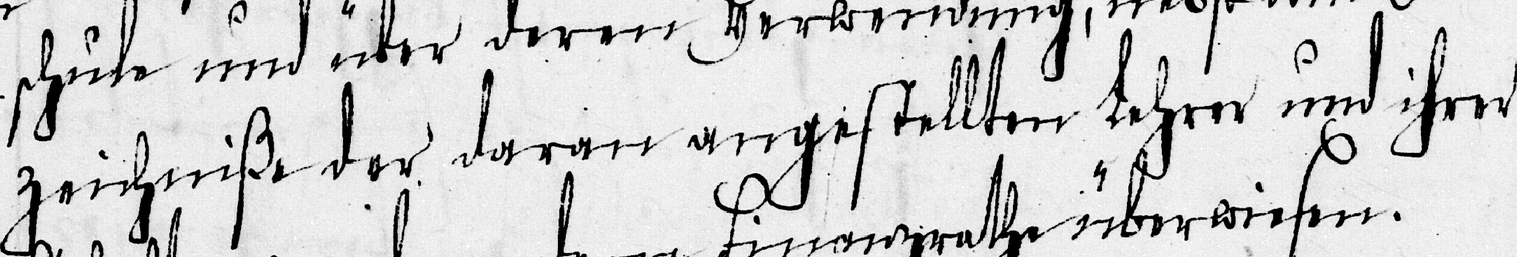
zeichniße der daran angestellten Lehrer und ihrer
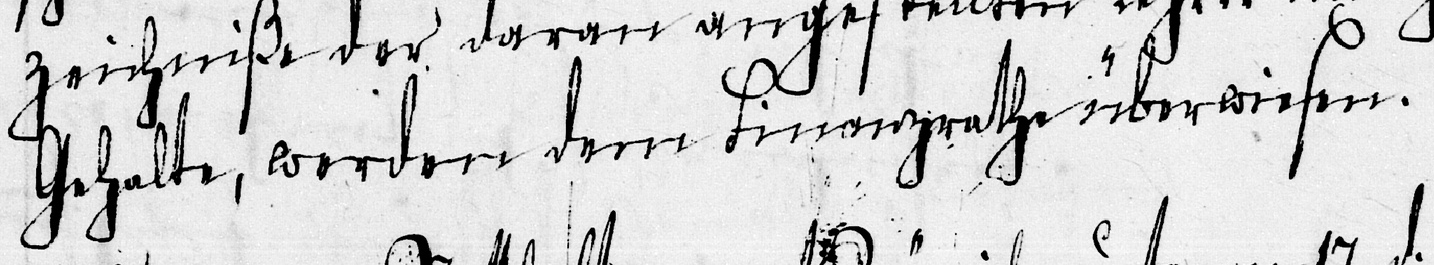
Gehalte, werden dem Finanzrathe überwiesen.
